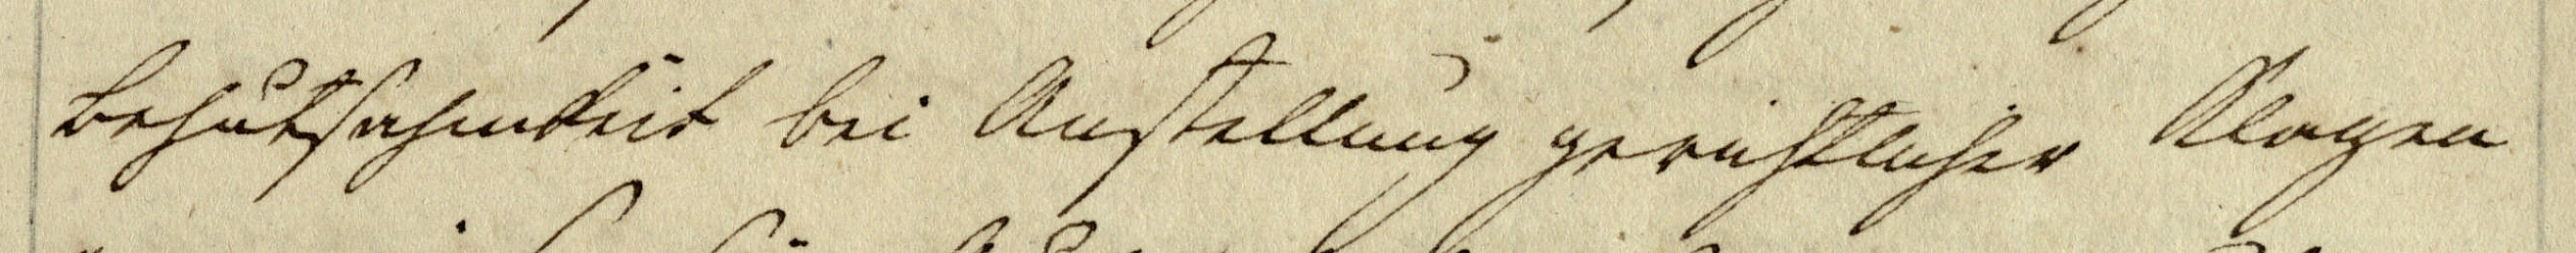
Behutsahmkeit bei Anstellung gerichtlicher Klagen
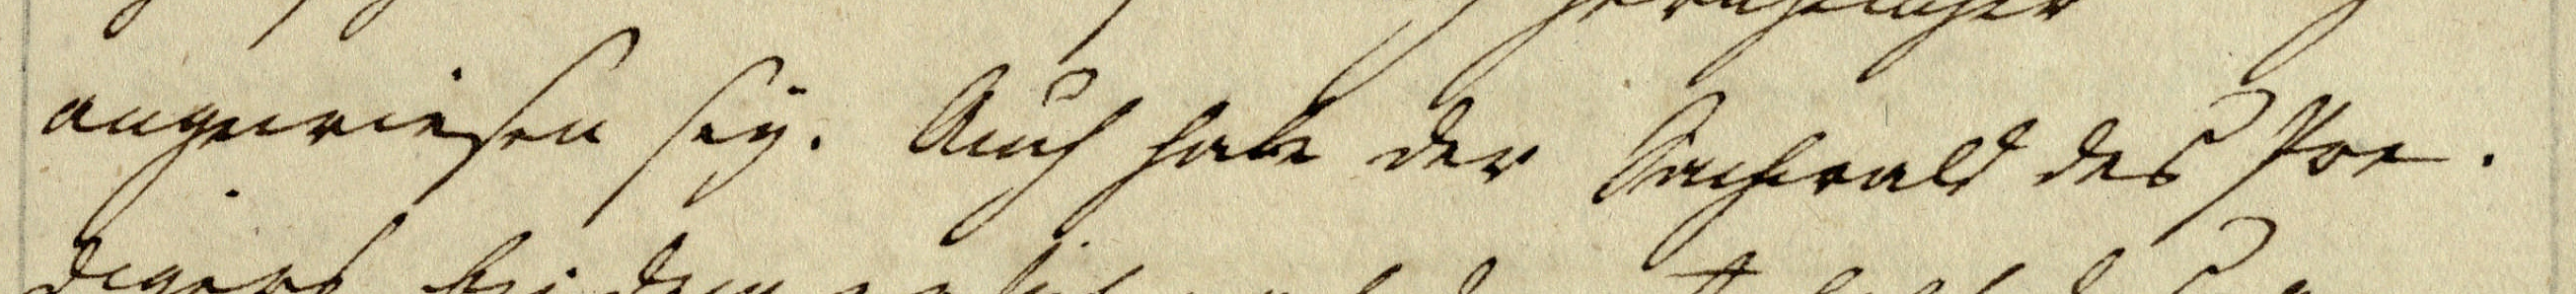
angewiesen seÿ. Auch habe der Sachwald des Pre¬
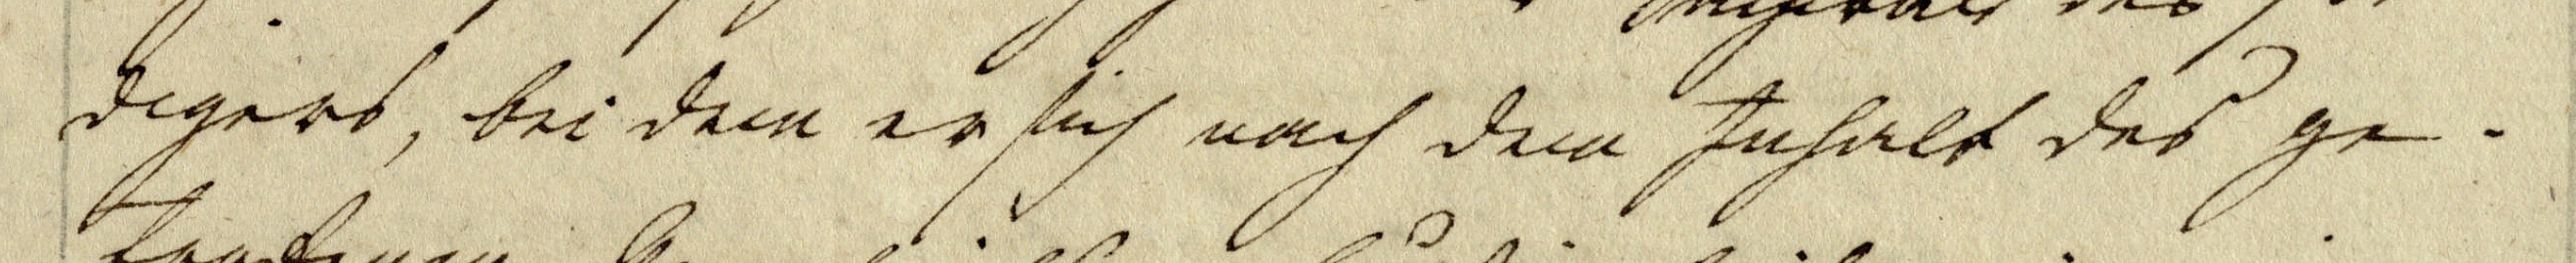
digers, bei dem er sich nach dem Inhalt des ge¬
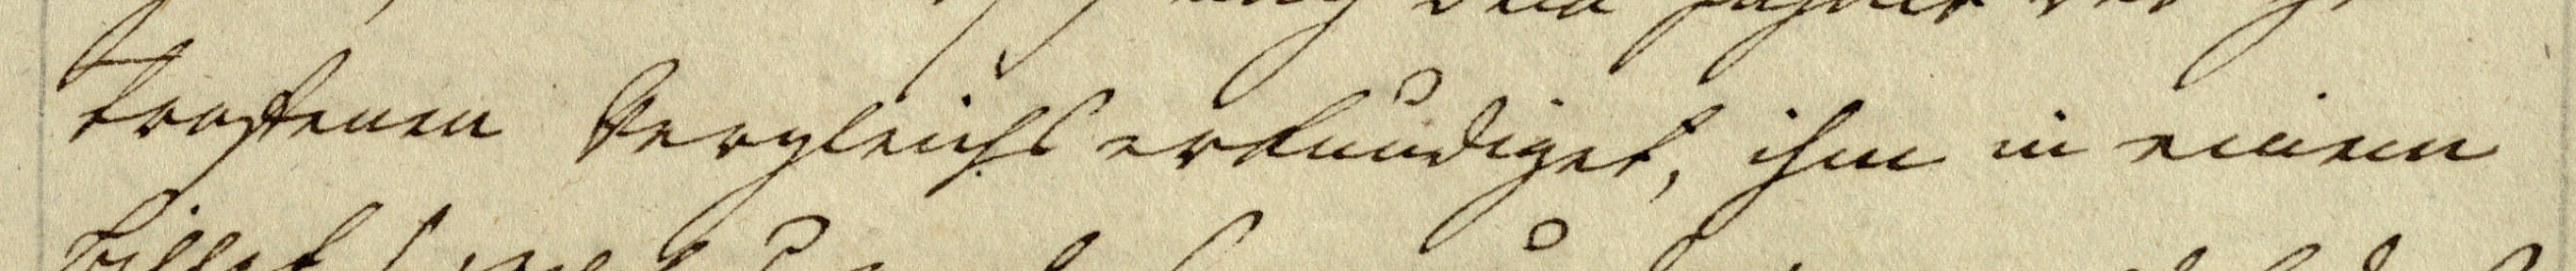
troffenen Vergleichs erkundiget, ihm in einem
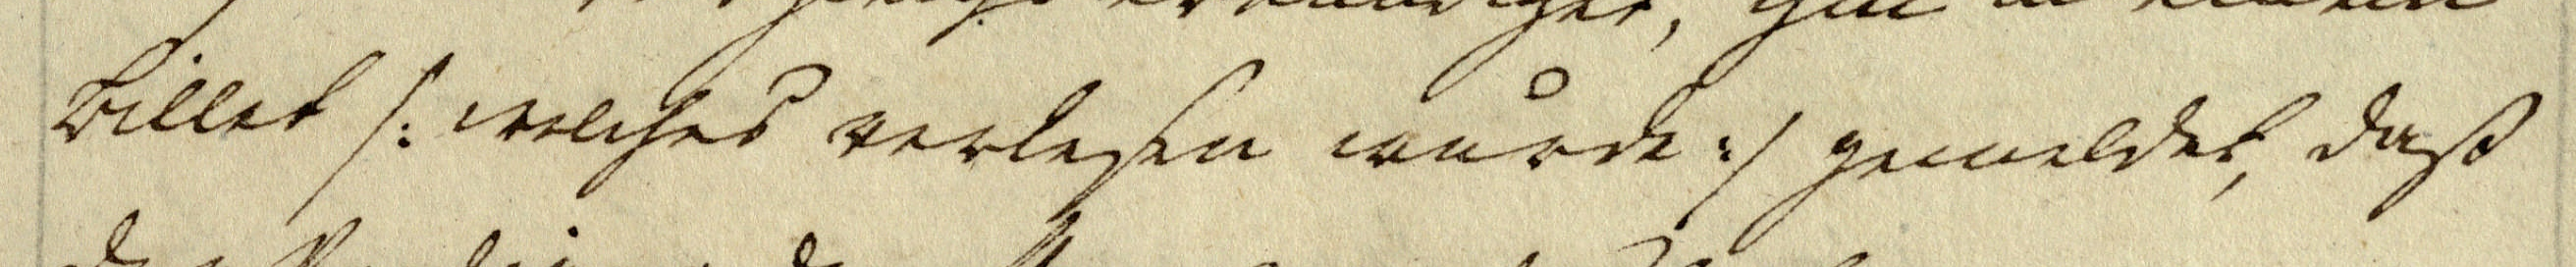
Billet /: welches verlesen wurde :/ gemeldet, daß
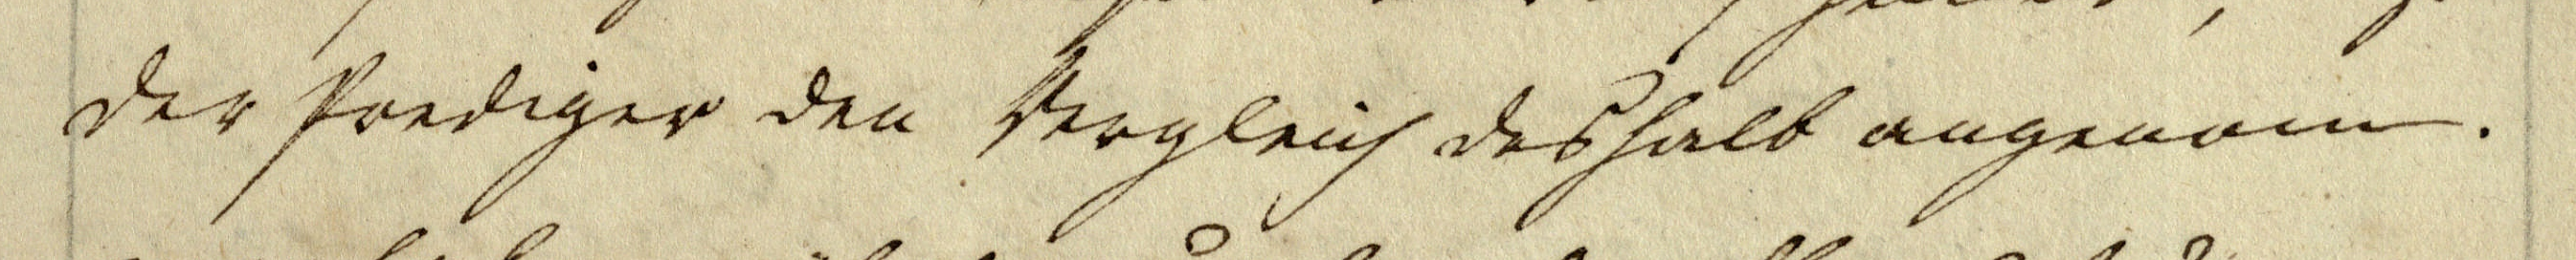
der Prediger den Vergleich deshalb angenom¬
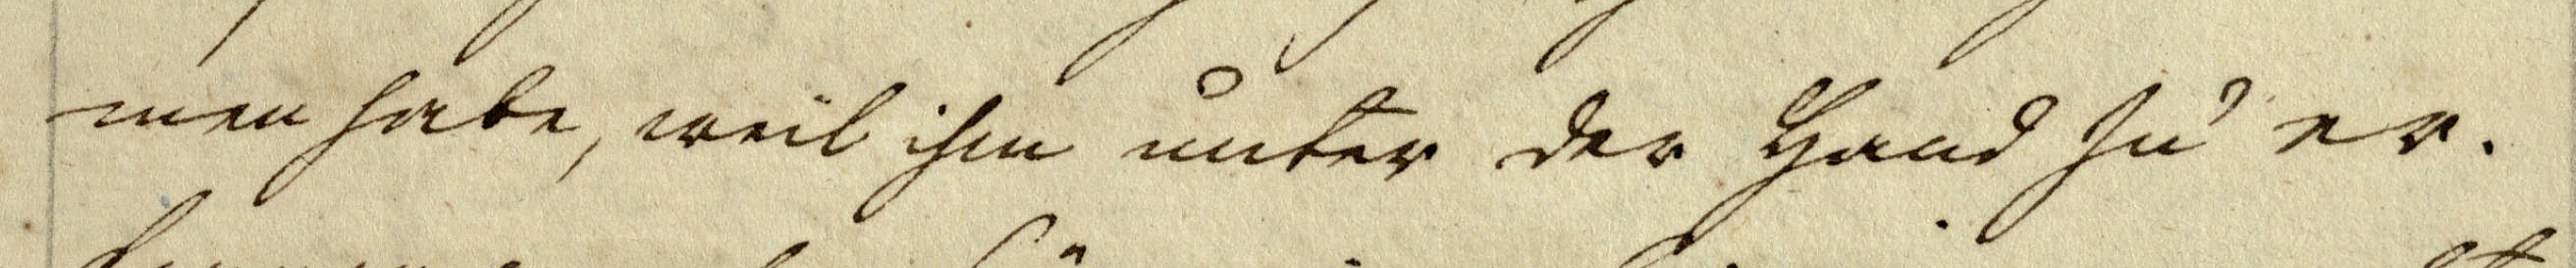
men habe, weil ihm unter der Hand zu er¬
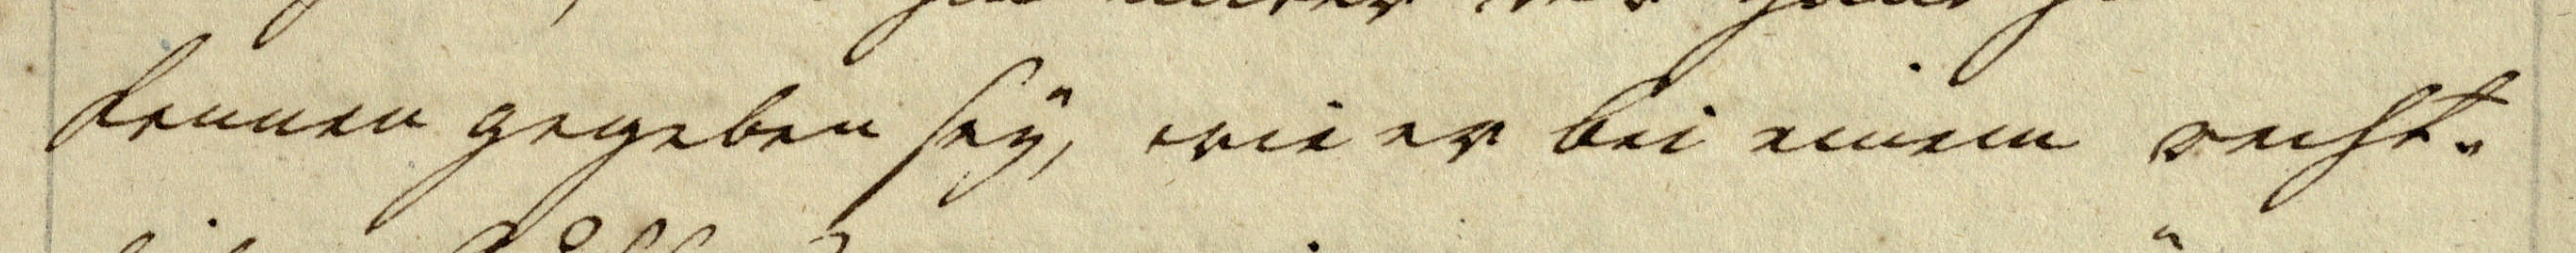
kennen gegeben seÿ, wie er bei einem recht¬
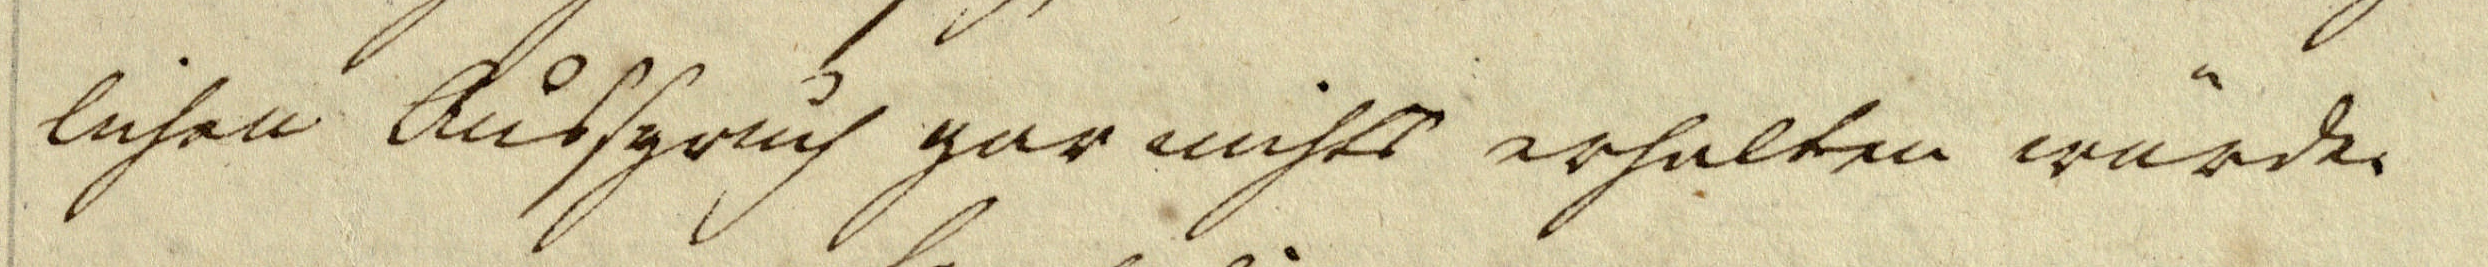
lichen Ausspruch gar nichts erhalten würde.
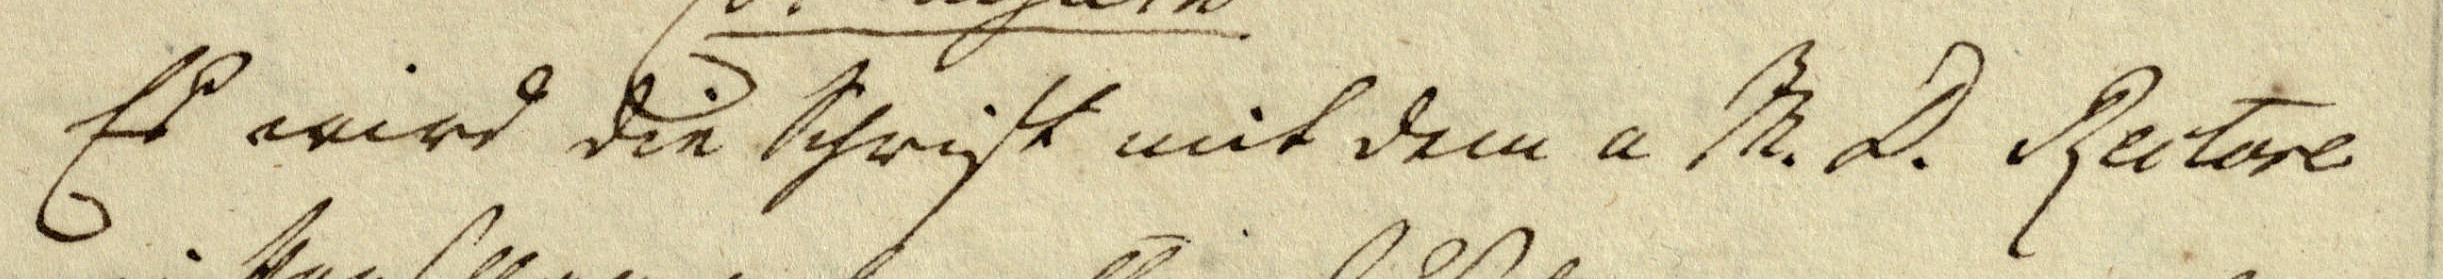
Es wird die Schrift mit dem a M. D. Rectore
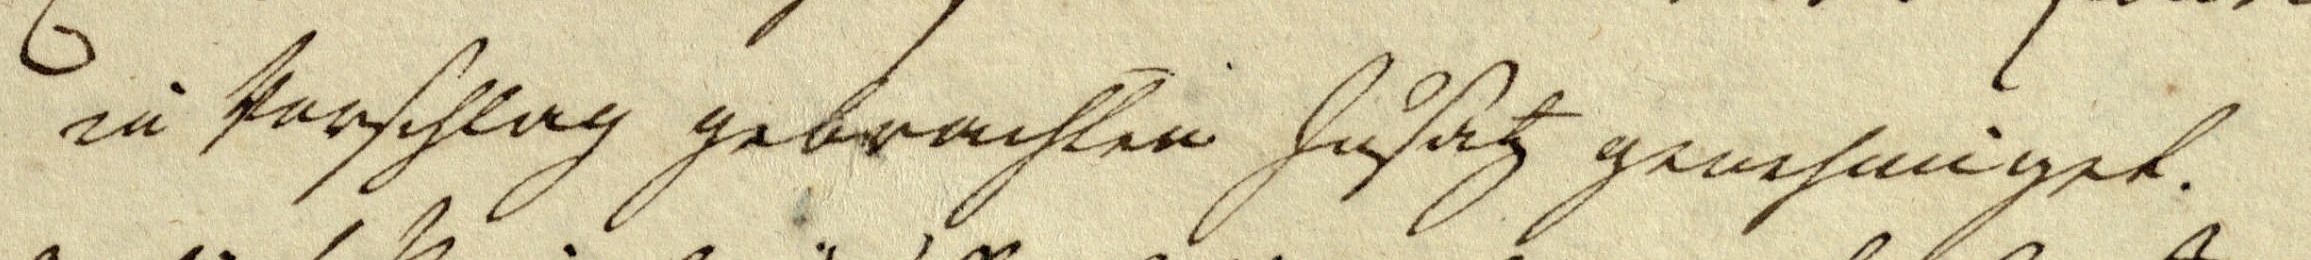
in Vorschlag gebrachten Zusatz genehmiget.
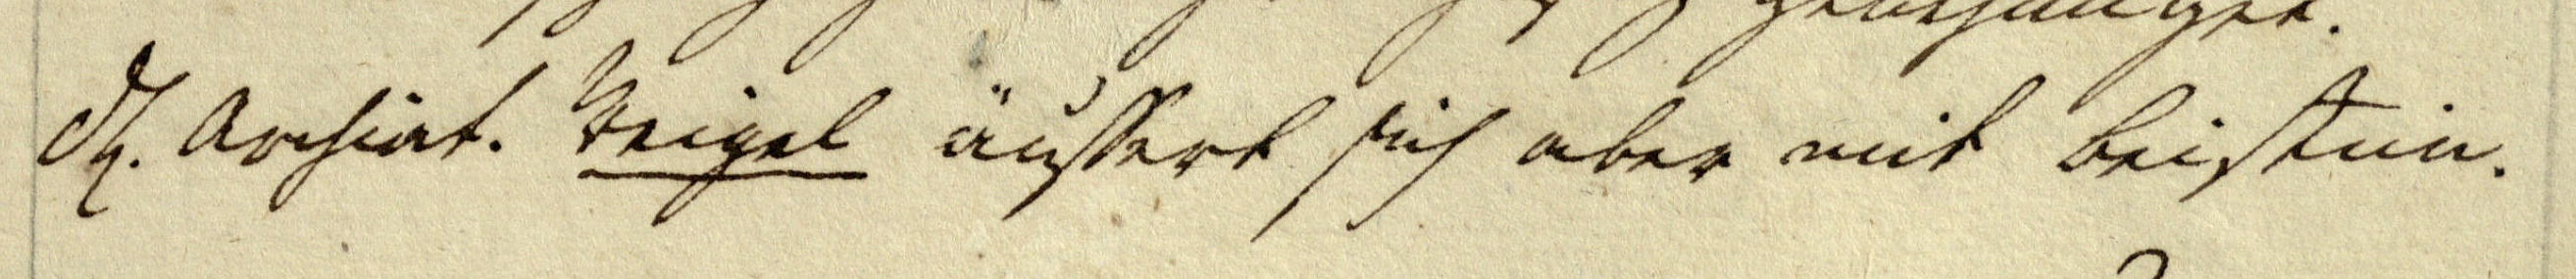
dh. Archiat. Weigel äussert sich aber mit Beistim¬
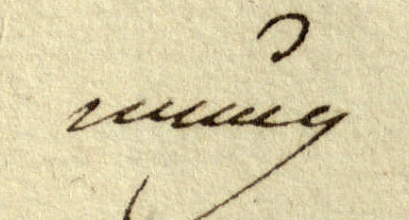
mung
